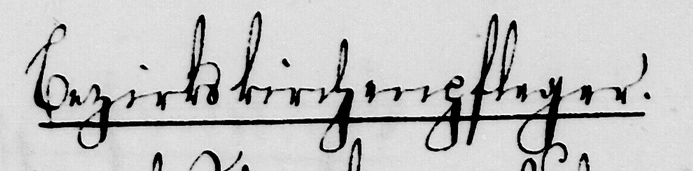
Bezirkskirchenpfleger.
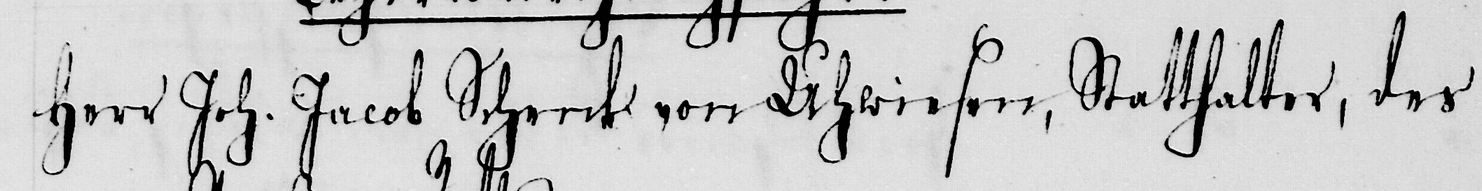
Herr Joh. Jacob Schenk von Uhwiesen, Statthalter, des
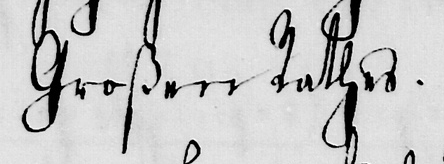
Großen Rathes.
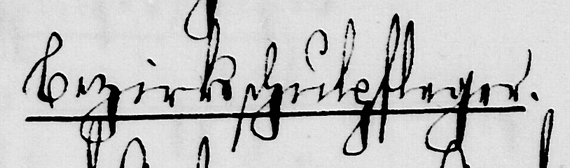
Bezirksschulpfleger.
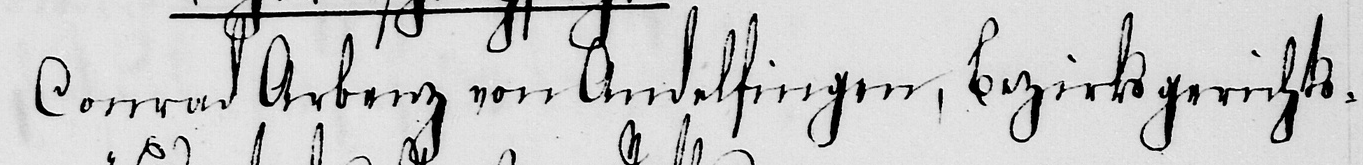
Conrad Arbenz von Andelfingen, Bezirksgerichts¬
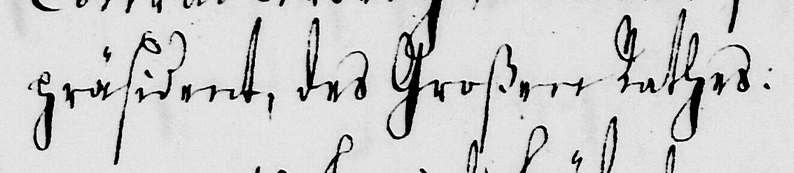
präsident, des Großen Rathes:
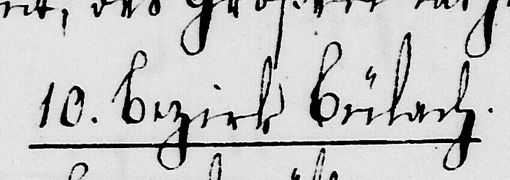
10. Bezirk Bülach.
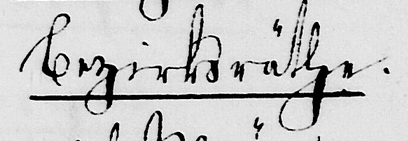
Bezirksräthe.
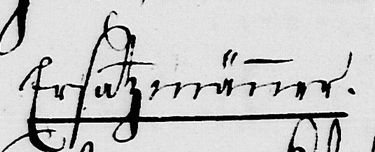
Ersatzmänner.
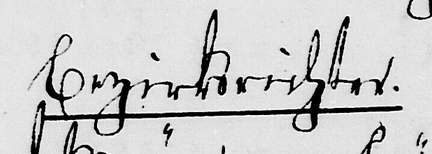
Bezirksrichter.
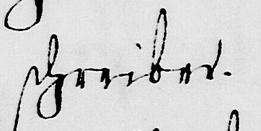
schreiber.
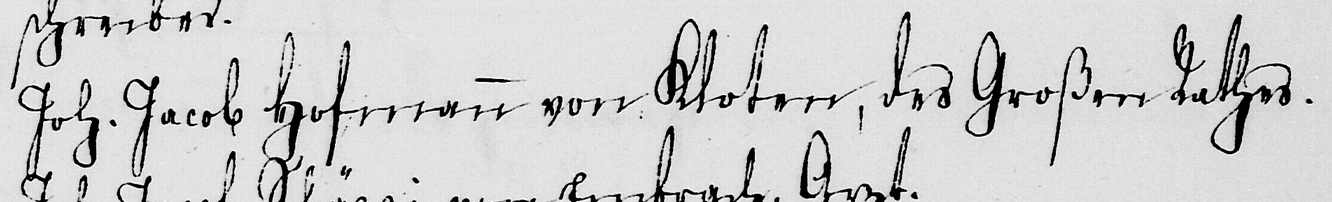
Joh. Jacob Hofmann von Kloten, des Großen Rathes.
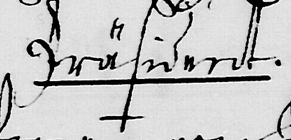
Präsident.
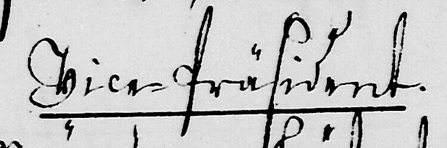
Vice-Präsident.
